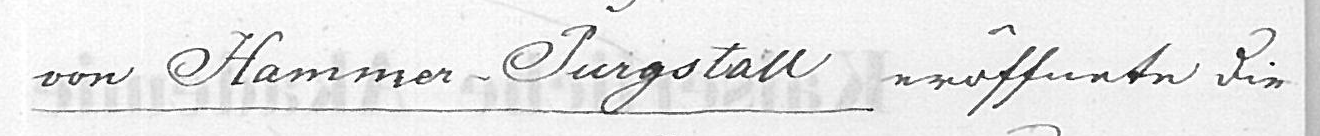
von Hammer-Purgstall eröffnete die
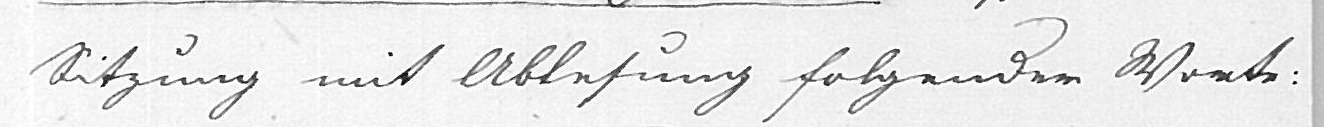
Sitzung mit Ablesung folgender Worte:
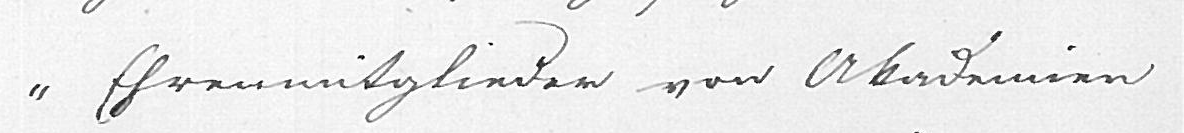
"Ehrenmitglieder von Akademien
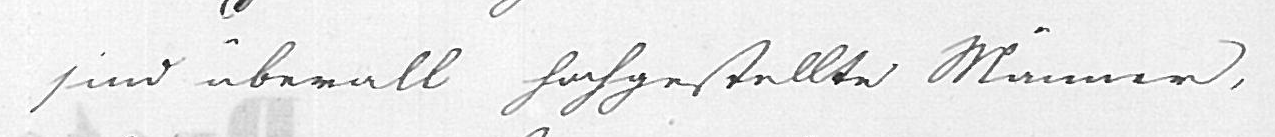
sind überall hochgestellte Männer,
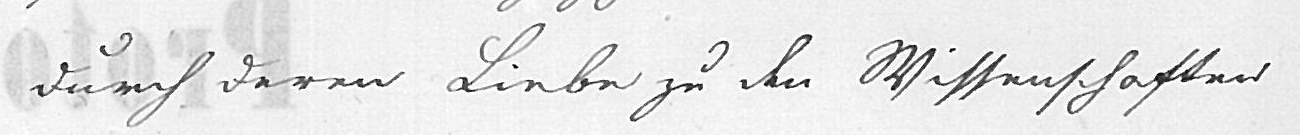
durch deren Liebe zu den Wissenschaften
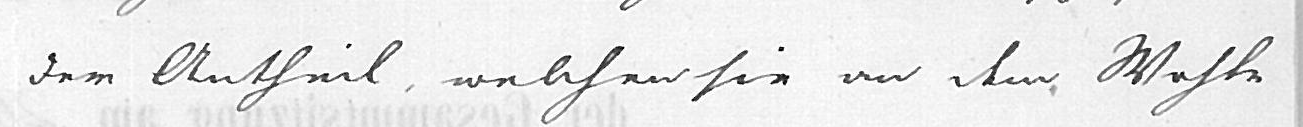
der Antheil, welchen sie an dem Wohle
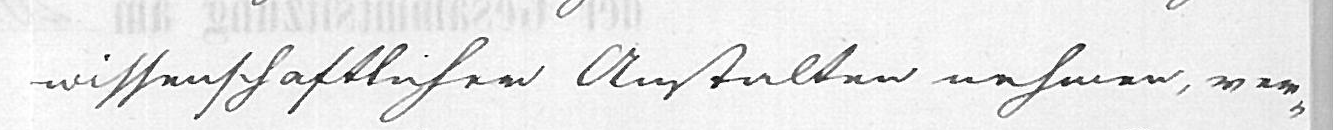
wissenschaftlicher Anstalten nehmen, ver-
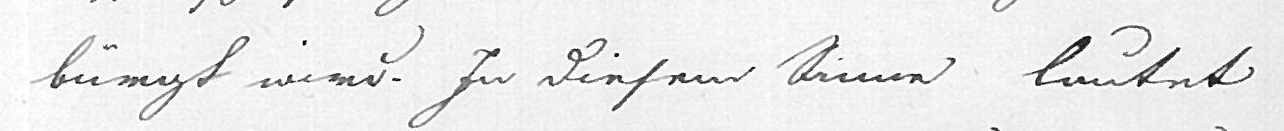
bürgt wird. In diesem Sinne lautet
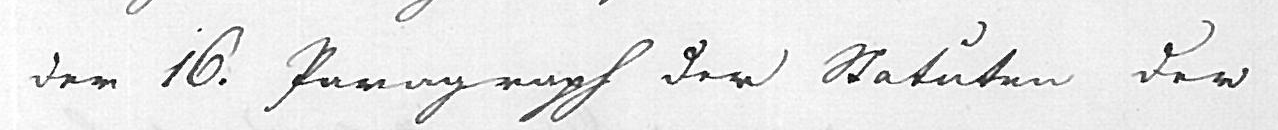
der 16. Paragraph der Statuten der
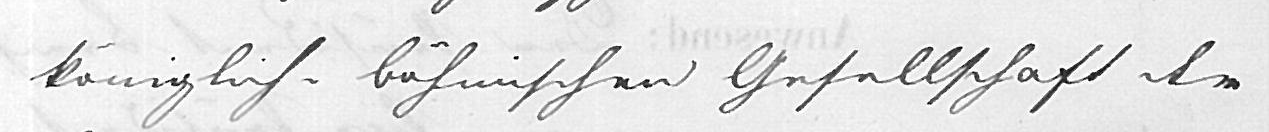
königlich-böhmischen Gesellschaft der
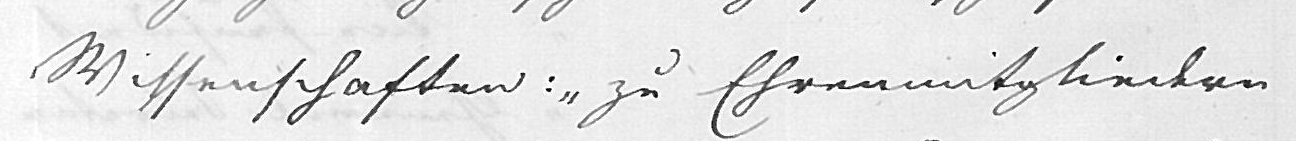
Wissenschaften: "zu Ehrenmitgliedern
